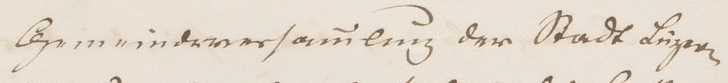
Gemeindeversammlung der Stadt Luzern
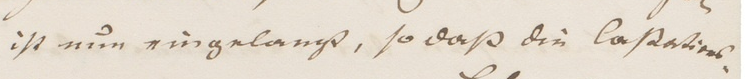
ist nun eingelangt, so daß die Caßations-
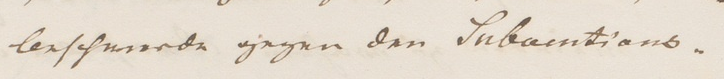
beschwerde gegen den Subventions-
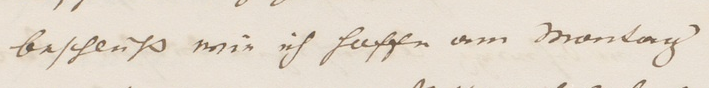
beschluß wie ich hoffe am Montag
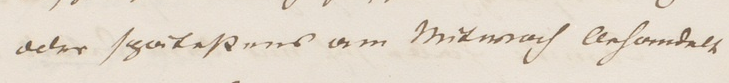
oder spätestens am Mitwoch behandelt
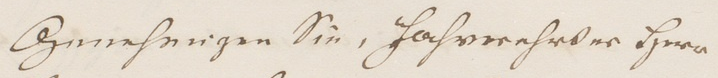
Genehmigen Sie, hochverehrter Herr
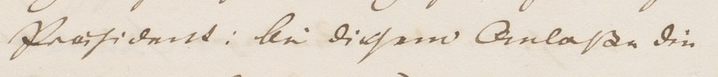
Präsident: bei diesem Anlaße die
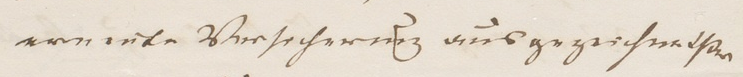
erneute Versicherung ausgezeichnetster
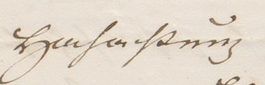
Hochachtung
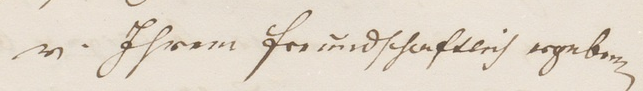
v. Ihrem freundschaftlich ergebenen
